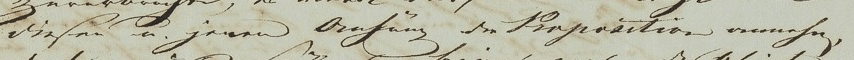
diesen u. jenen Anhängen die Proposition annehmen,
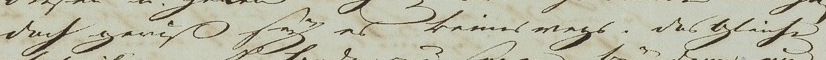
doch gewiß sey es keineswegs. Das Gleiche
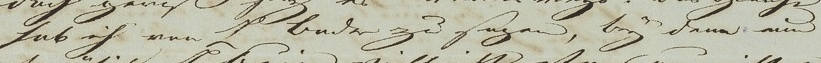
hab ich von Herrn Bader zu sagen, bey dem nun
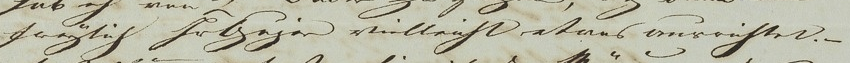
freylich Hr Gujer vielleicht etwas ausrichtet. –
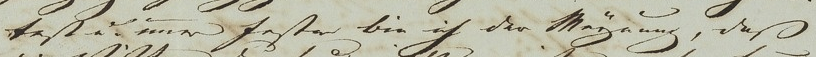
Fest u. immer fester bin ich der Meynung, daß
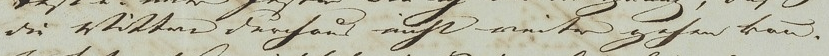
die Wittwe durchaus nicht weiter gehen kann. –
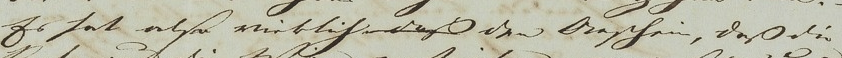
Es hat also wirklich den Anschein, daß die
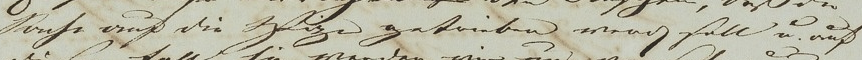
Sache auf die Spize getrieben werden soll u. auf
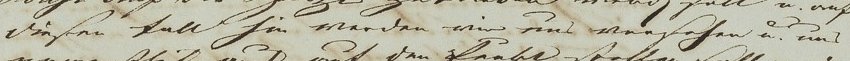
diesen Fall hin werden wir uns vorsehen u. uns
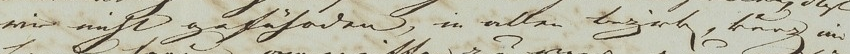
wir nicht gefährden, in allen Bezirken, kurz im
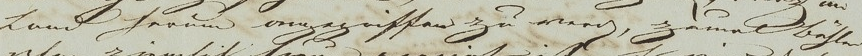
Land herum angegriffen zu werden, zumal Bühler
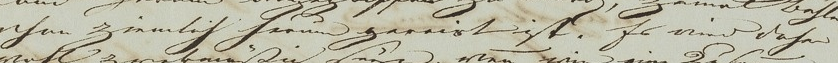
schon ziemlich herum gereist ist. Es wird daher
